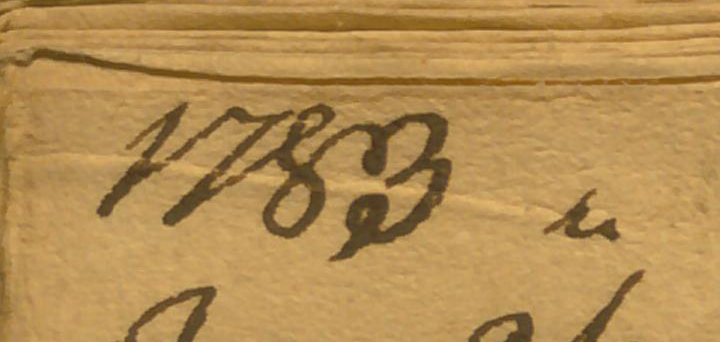1783
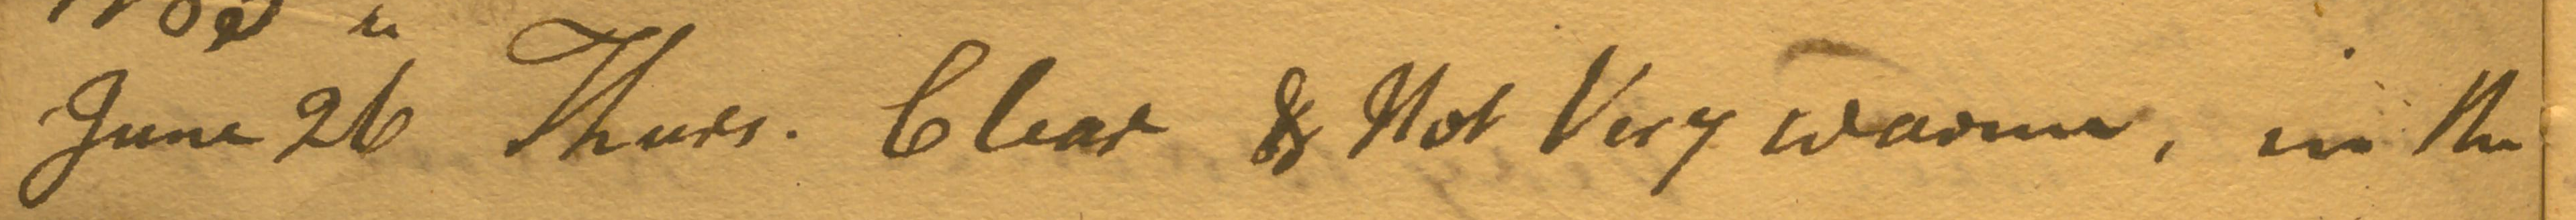June 26^th Thurs. Clear & Not Very warme, in the
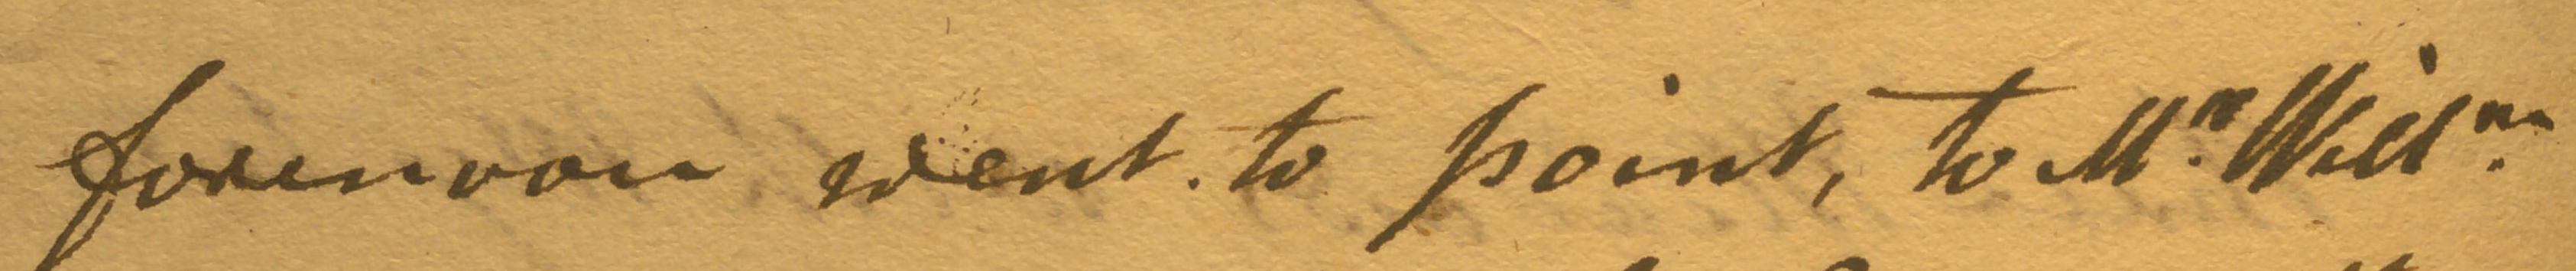forenoon went to point, to M^r. Will^m.
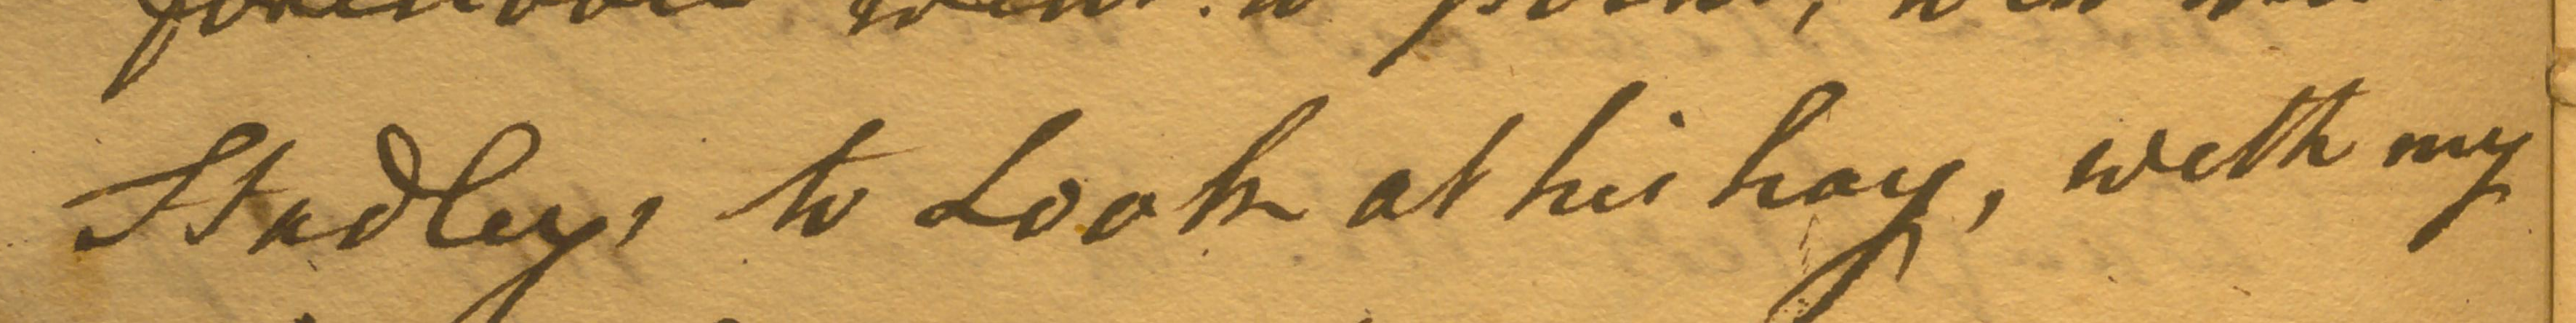Stadleys to Look at his hay, with my
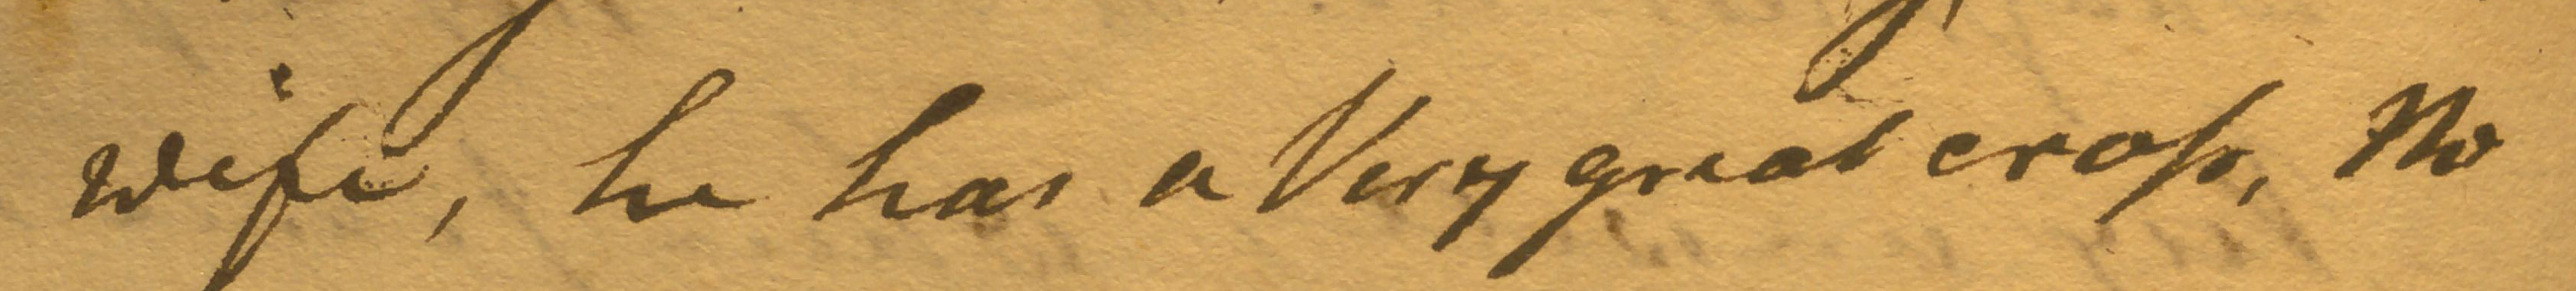wife, he has a Very great crop, No
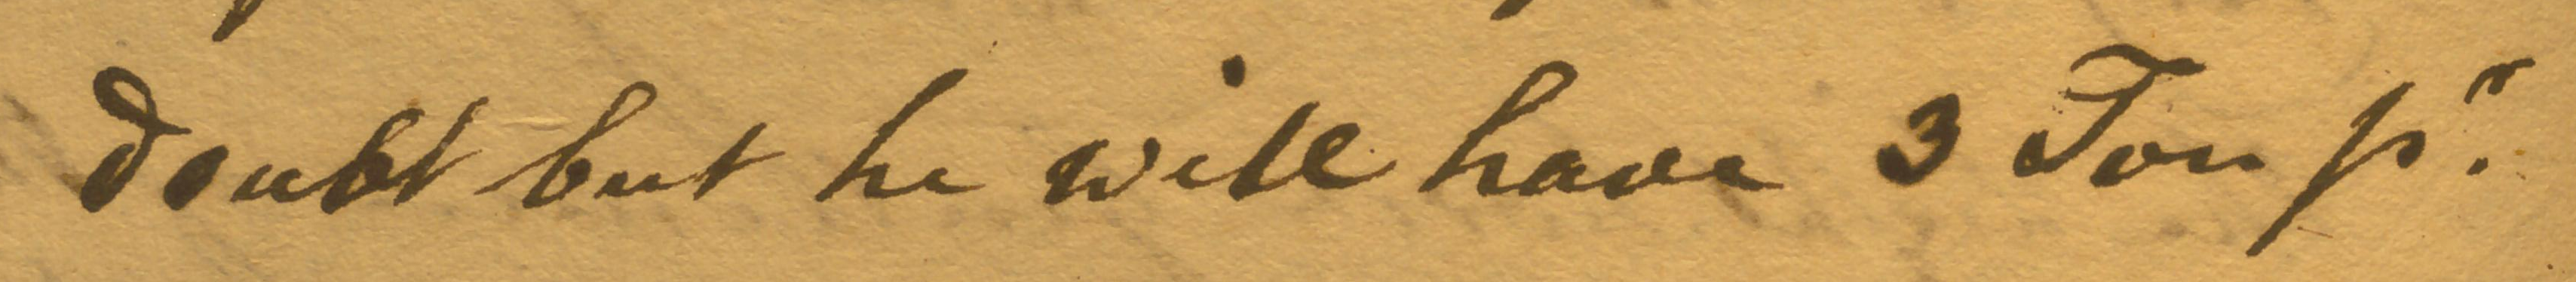doubt but he will have 3 Ton p^r.
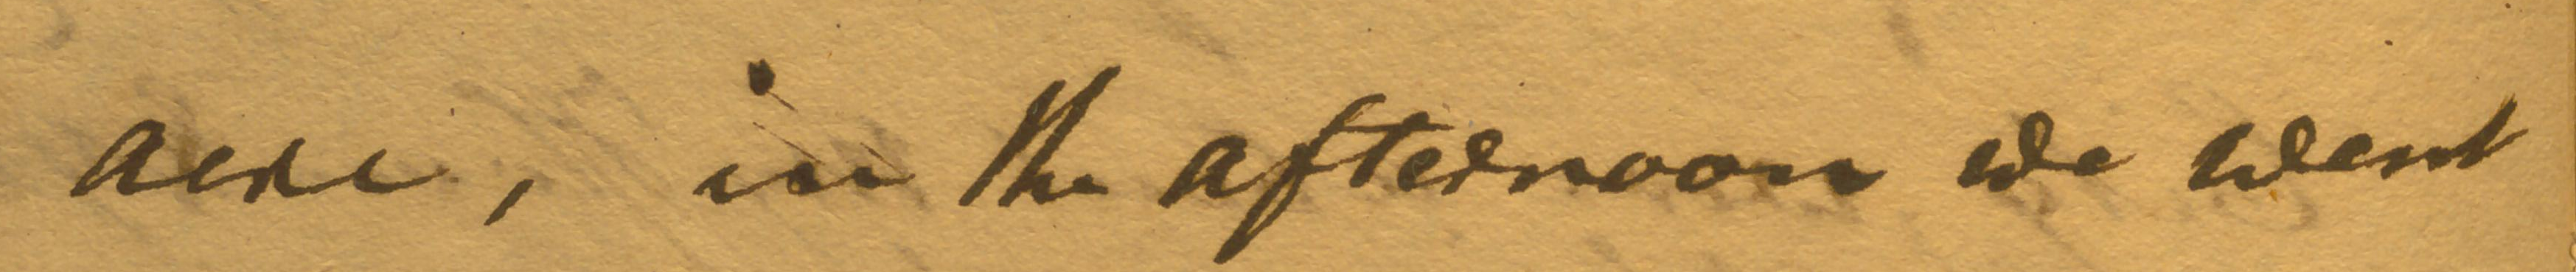acre, in the afternoon we went
